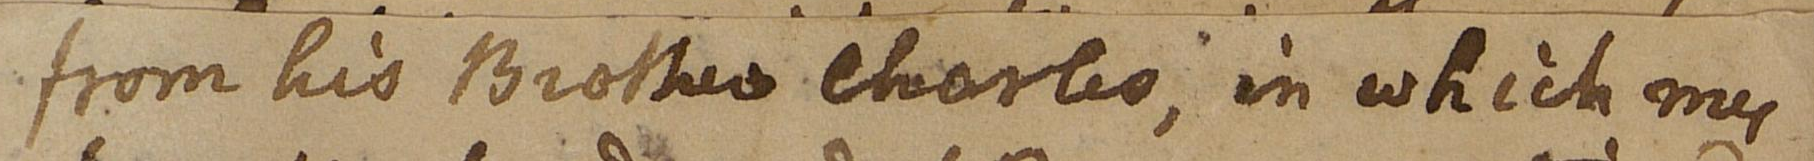from his Brother Charles, in which my
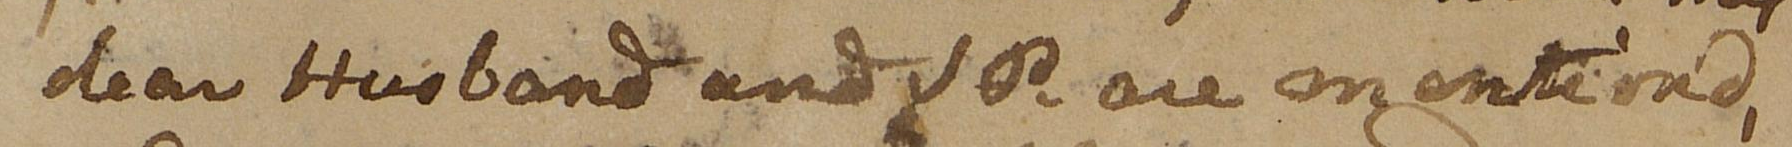dear Husband and S P. are mention'd,
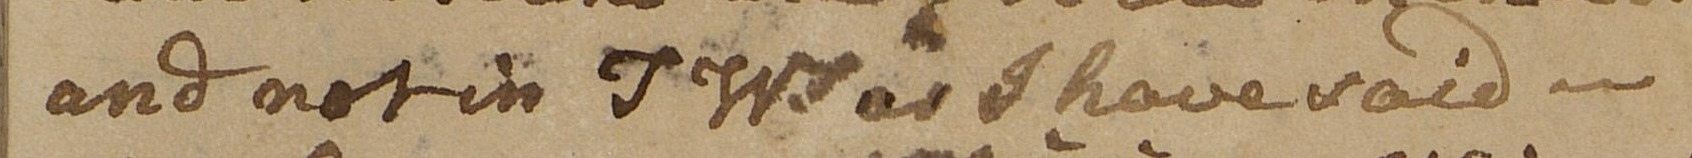and not in TW as I have said-
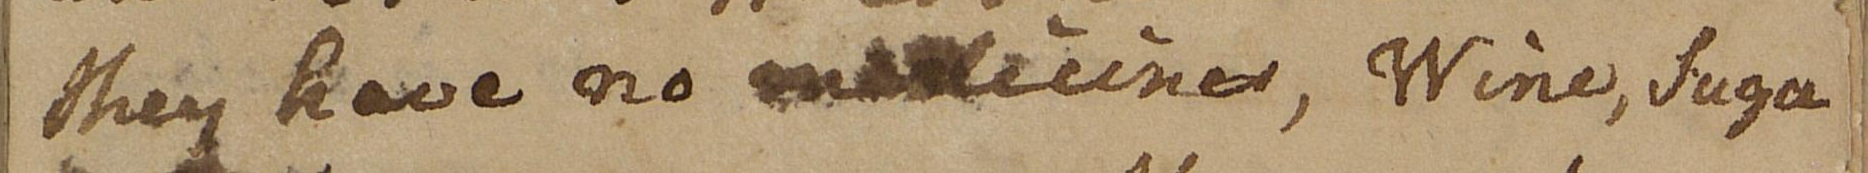they have no medicine, Wine, Suga
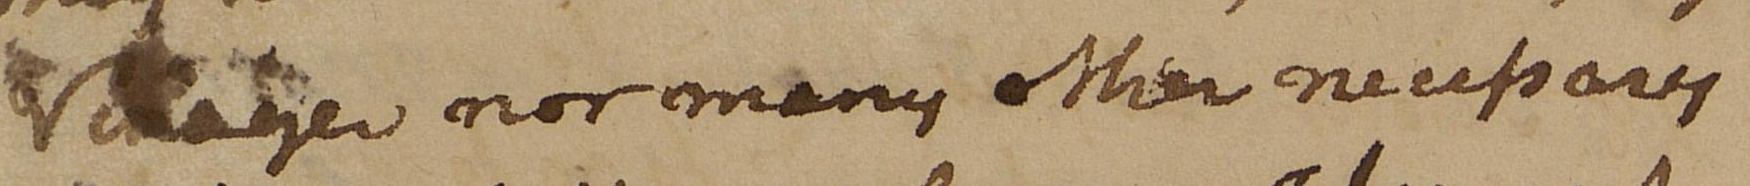Vinager nor many other necessary
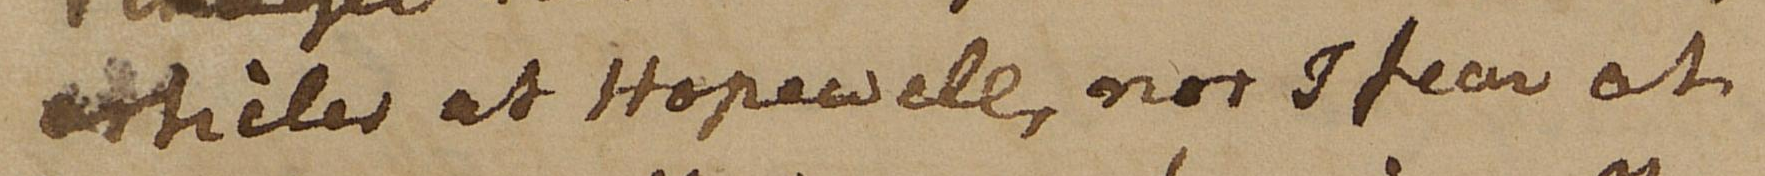articles at Hopewell, nor I fear at
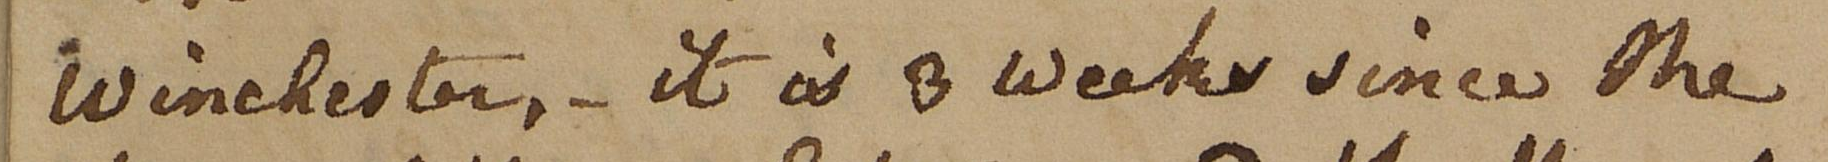Winchester,- it is 3 weeks since the
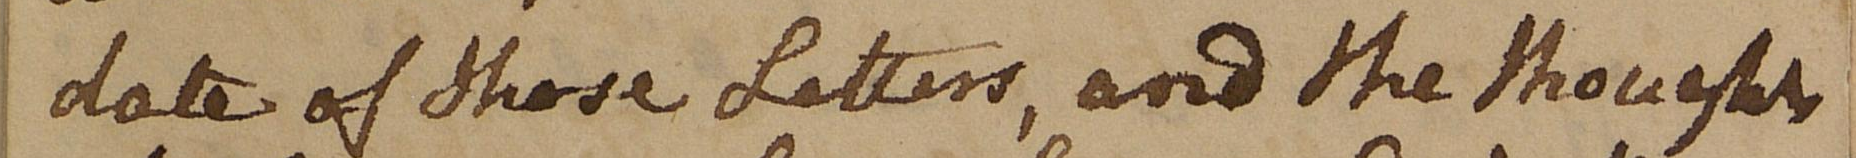date of those Letters, and the thought
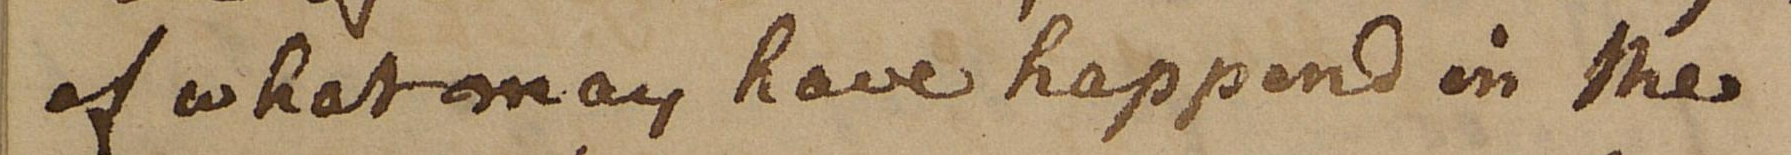of what may have happend in the
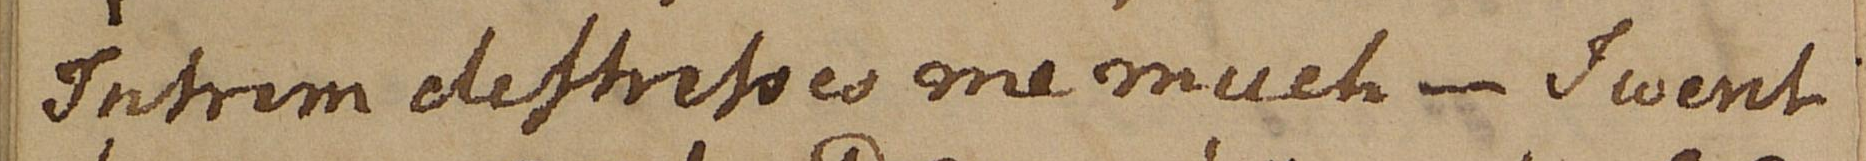Intrim destreses me much- I went
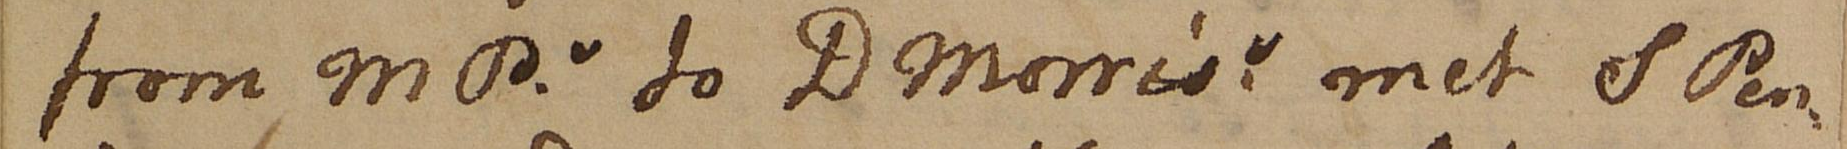from M P^s. to D Morris^s. met S Pen-
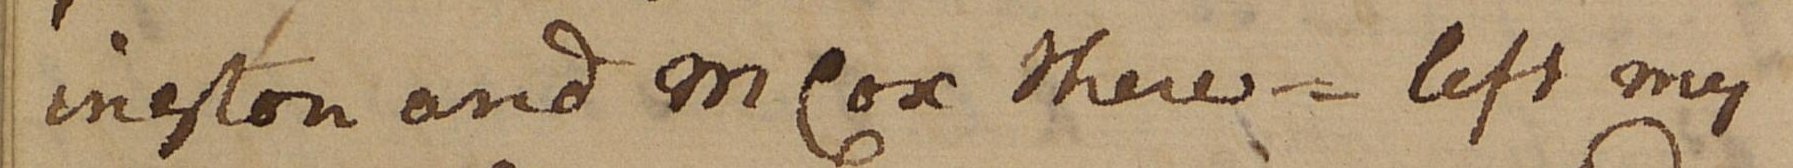ington and M Cox there- left my
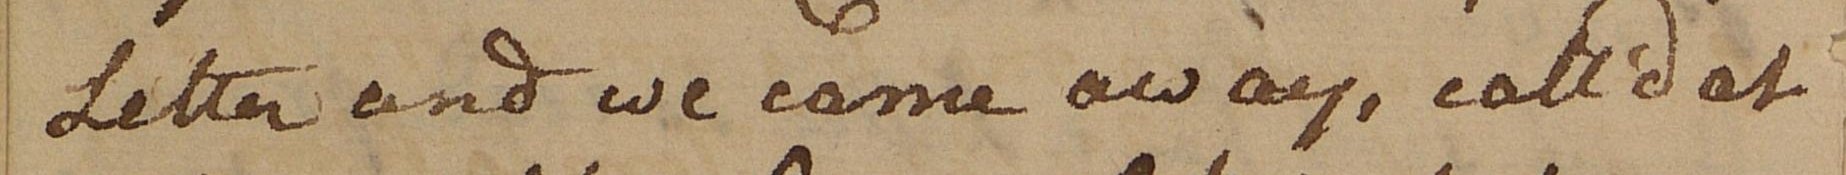Letter and we came away, call'd at
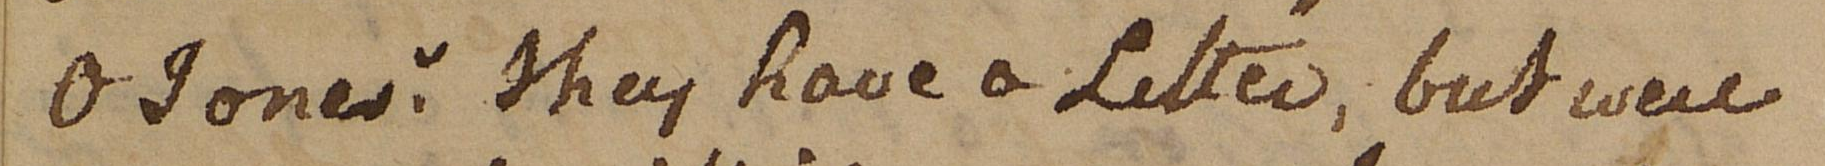O Jones^s. they have a Letter, but were
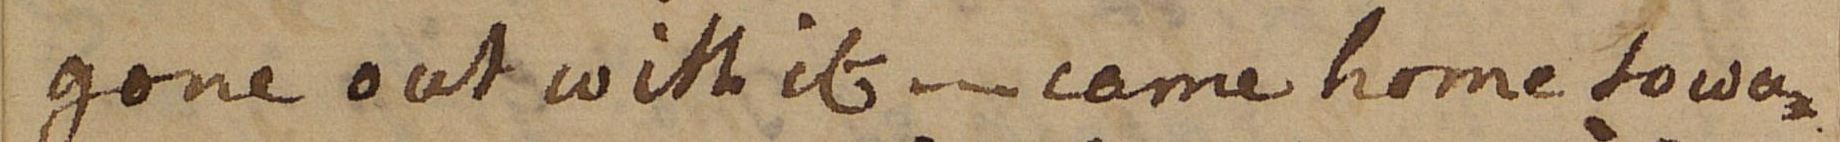gone out with it- came home towa-
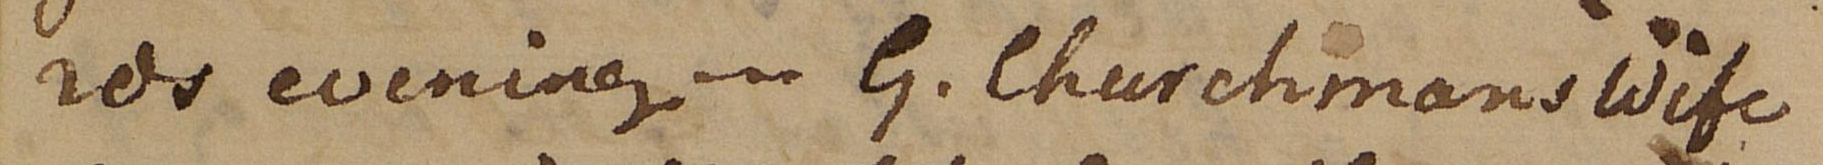rds evening- G. Churchmans wife
